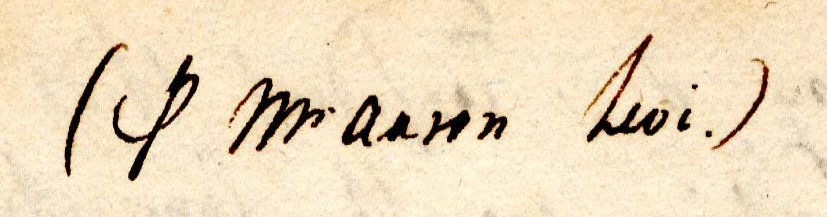(Per M^r Aaron Levi.)
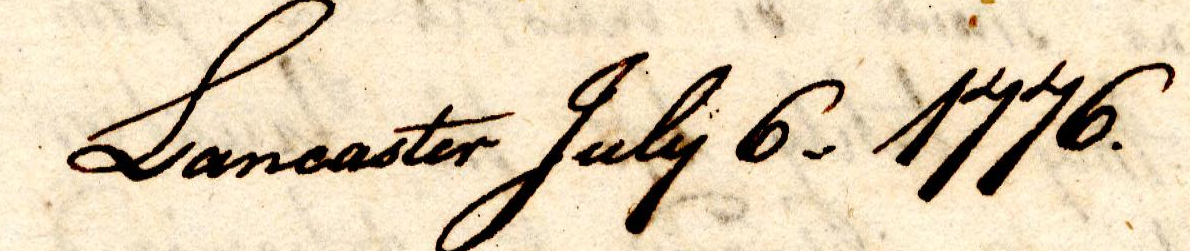Lancaster July 6. 1776.
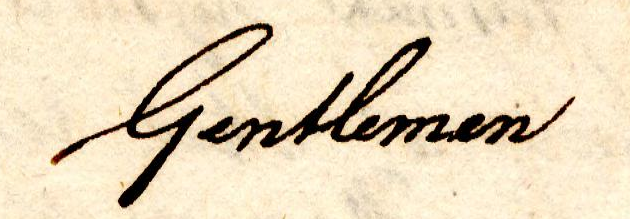Gentlemen
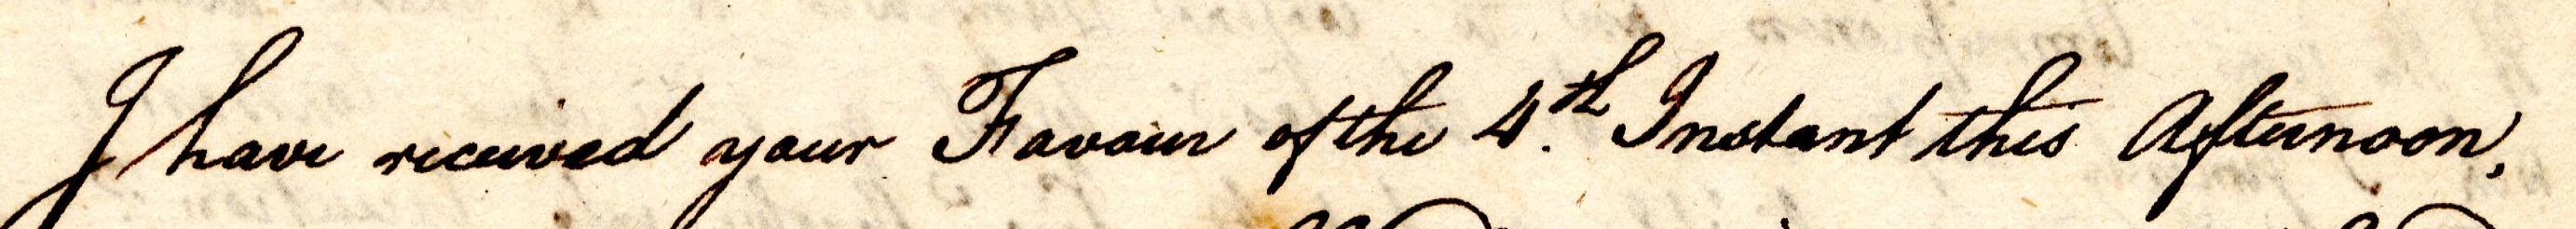I have received your Favour of the 4^th. Instant this Afternoon,
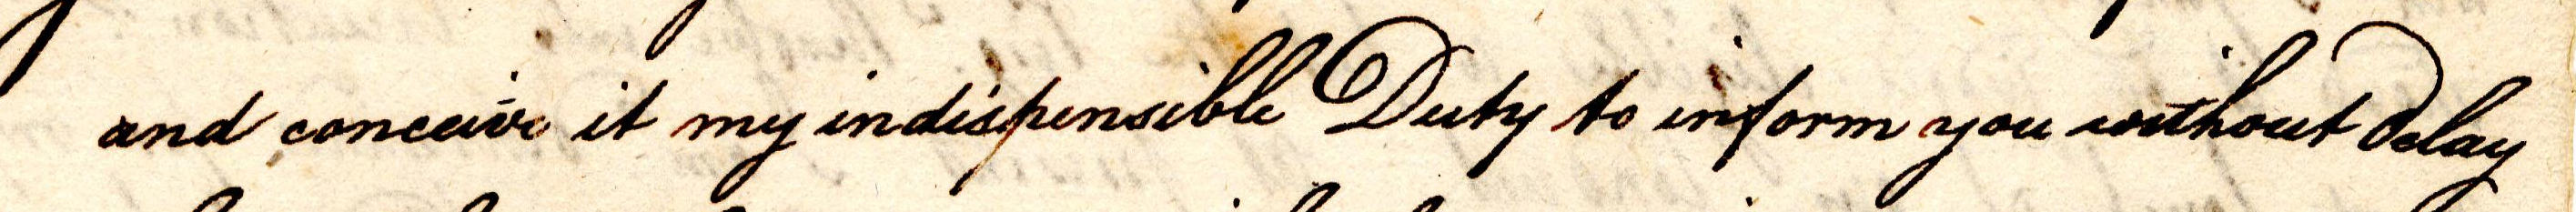and conceive it my indispensible Duty to inform you without delay
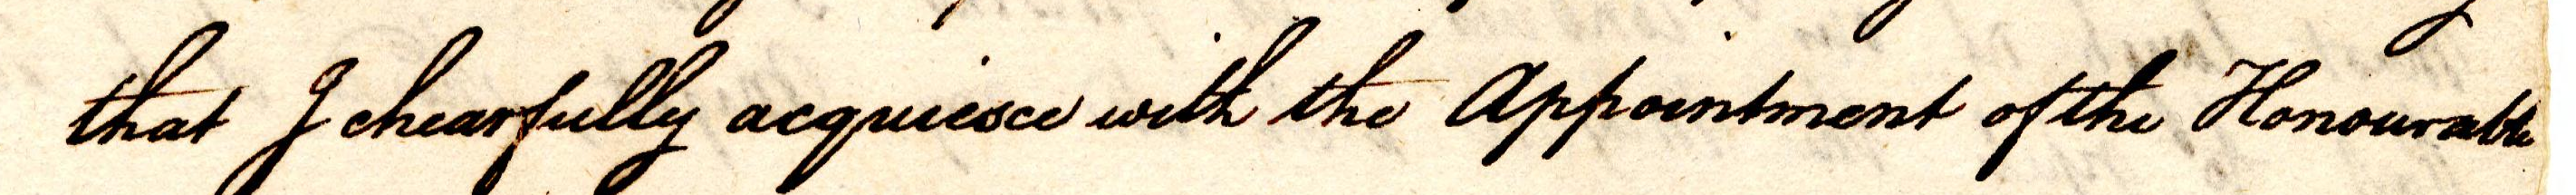that I chearfully acquiesce with the Appointment of the Honourable
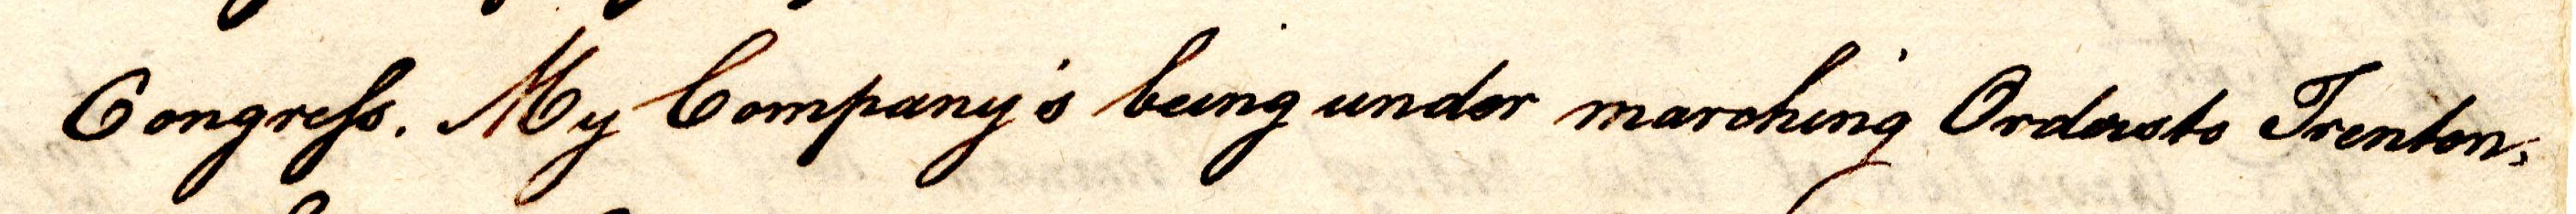Congress. My Company's being under marching Orders to Trenton,
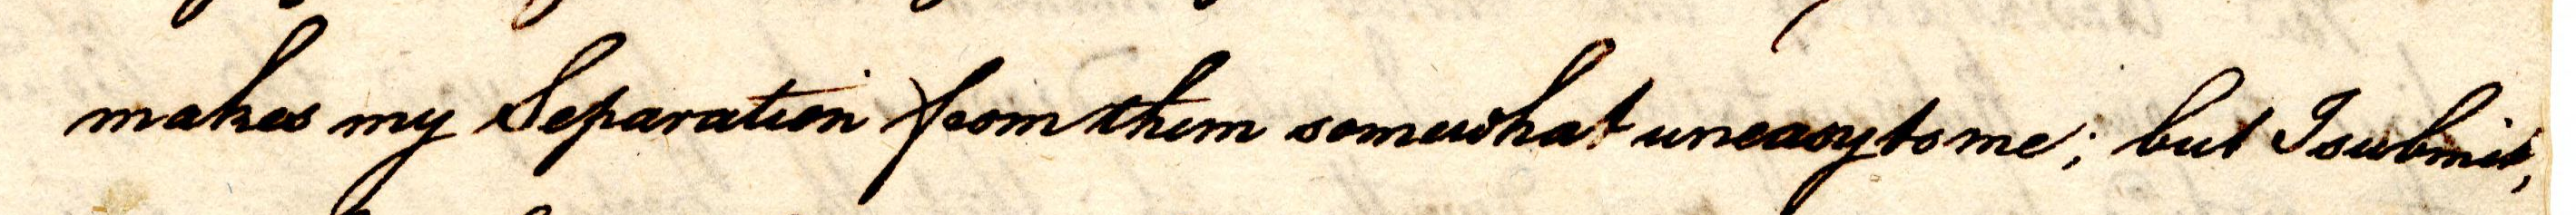makes my Separation from them somewhat uneasy to me; but I submit,
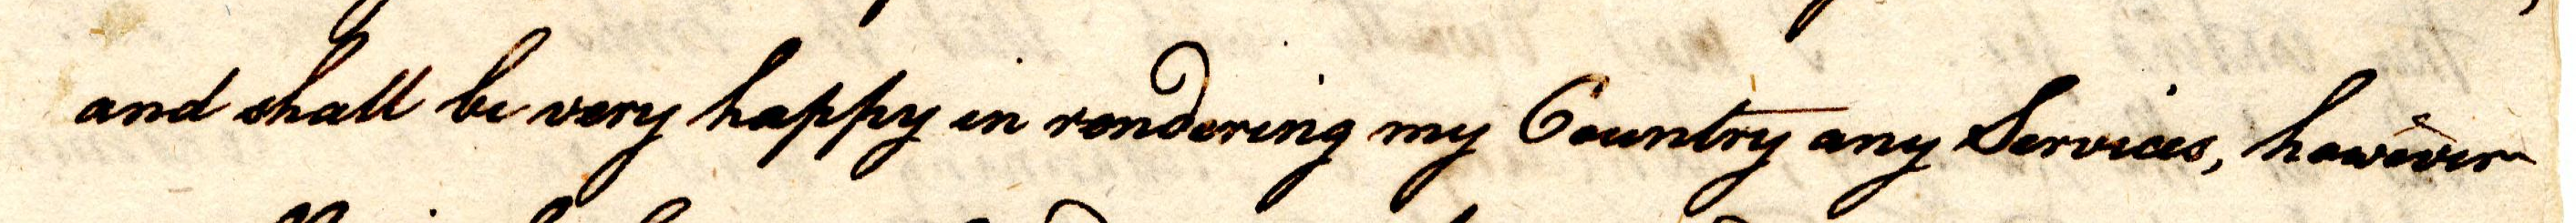and shall be very happy in rendering my Country any Services, however
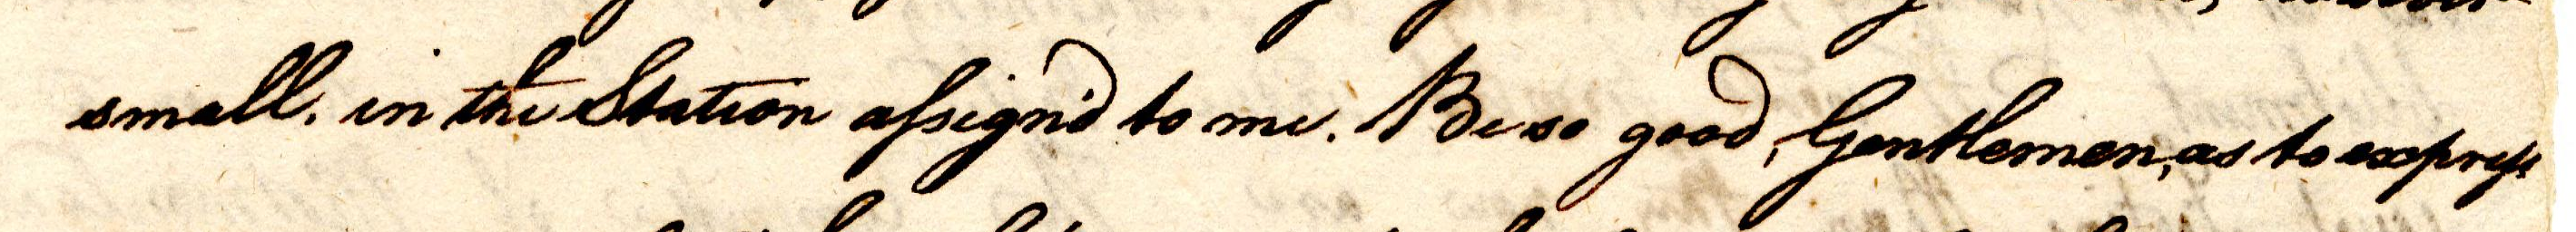small in the Station assign'd to me. Be so good, Gentlemen, as to express
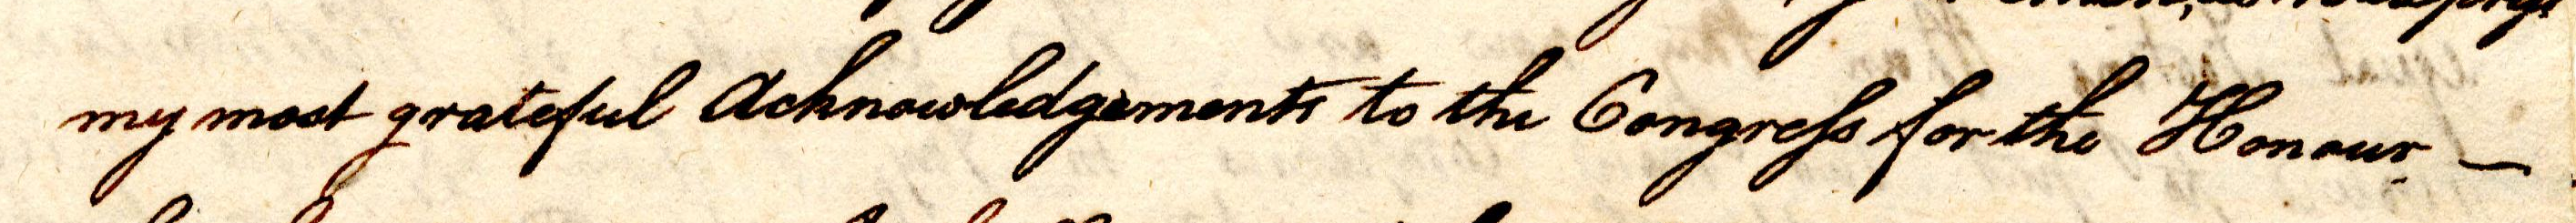my most grateful Acknowledgements to the Congress for the Honour –
